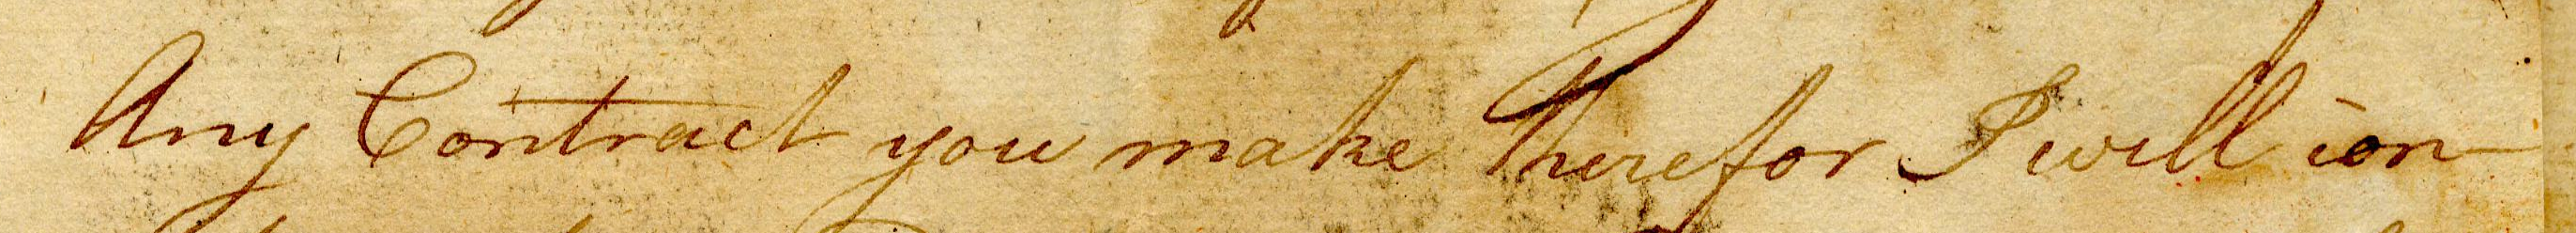Any Contract you make thereof I will con
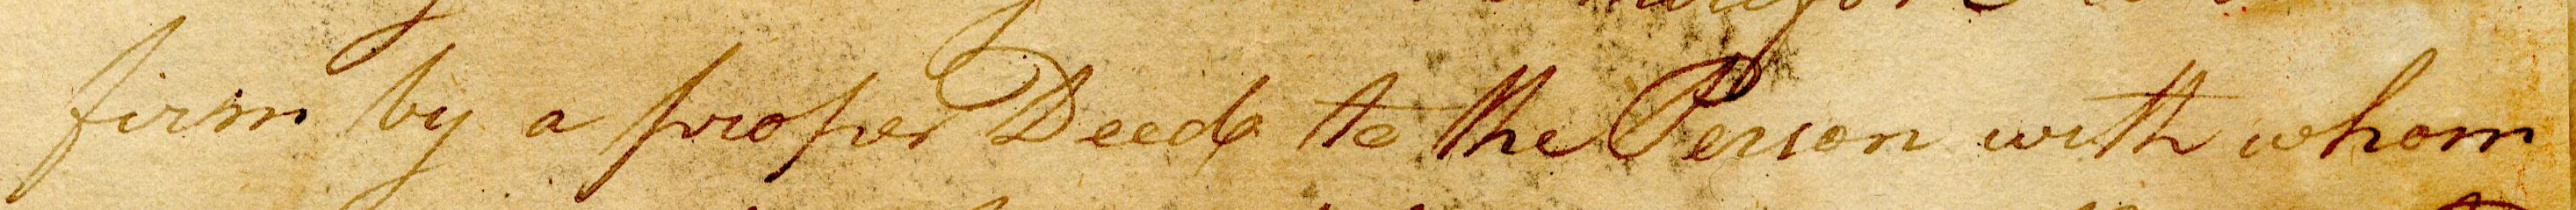firm by a proper Deed to the Person with whom
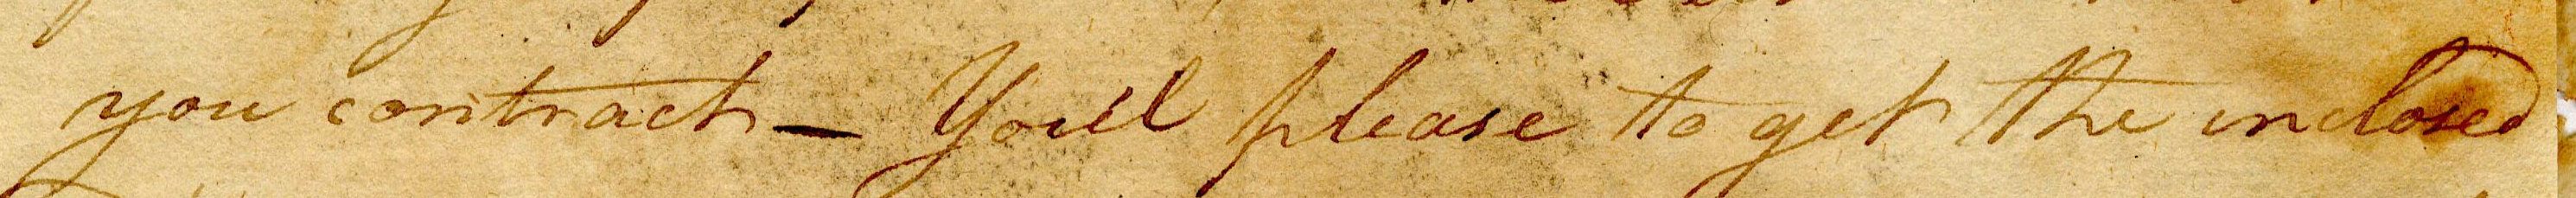you contract- Youll please to get the inclosed
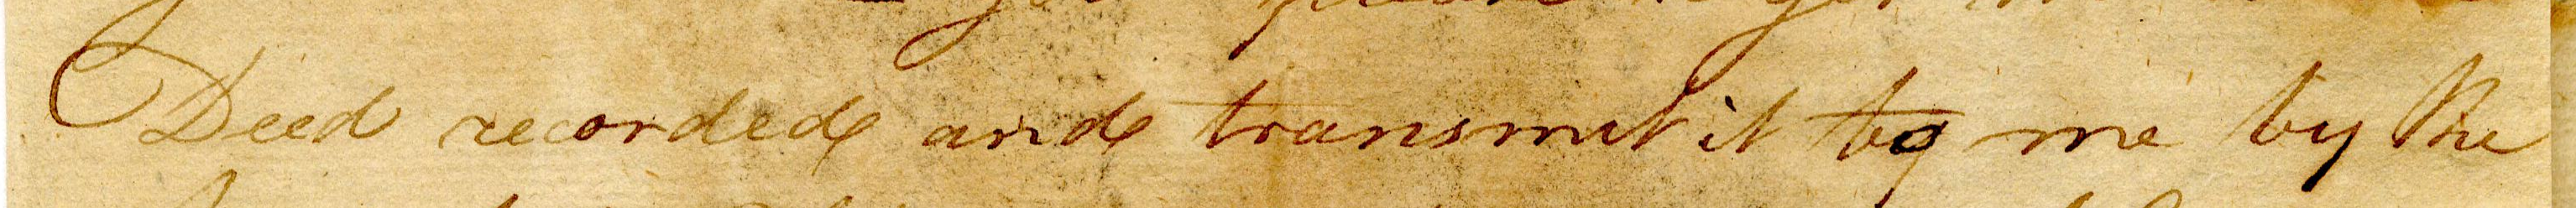Deed recorded and transmit it to me by the
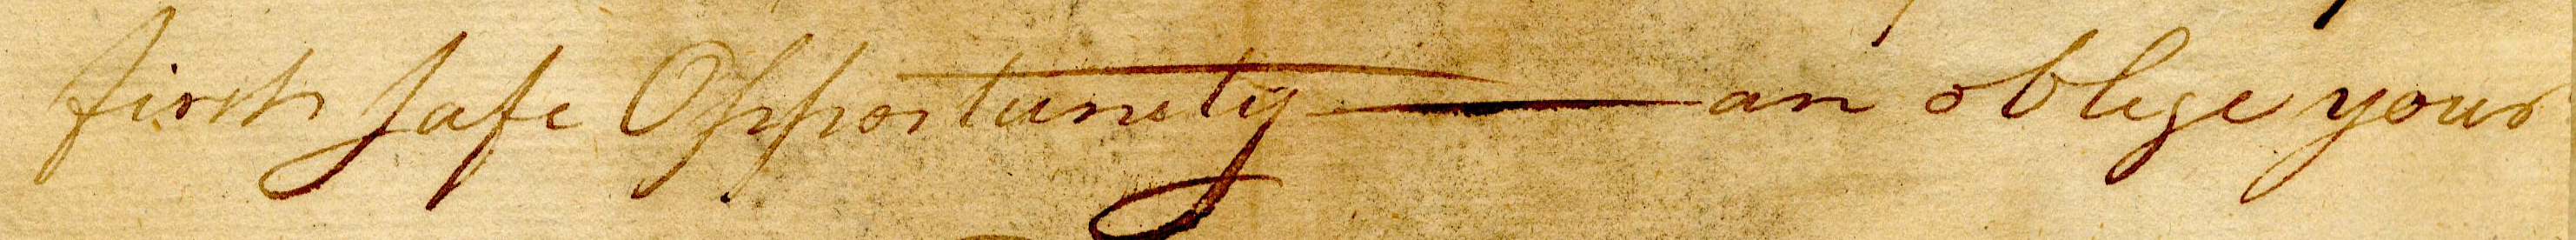first safe opportunity- an oblige your
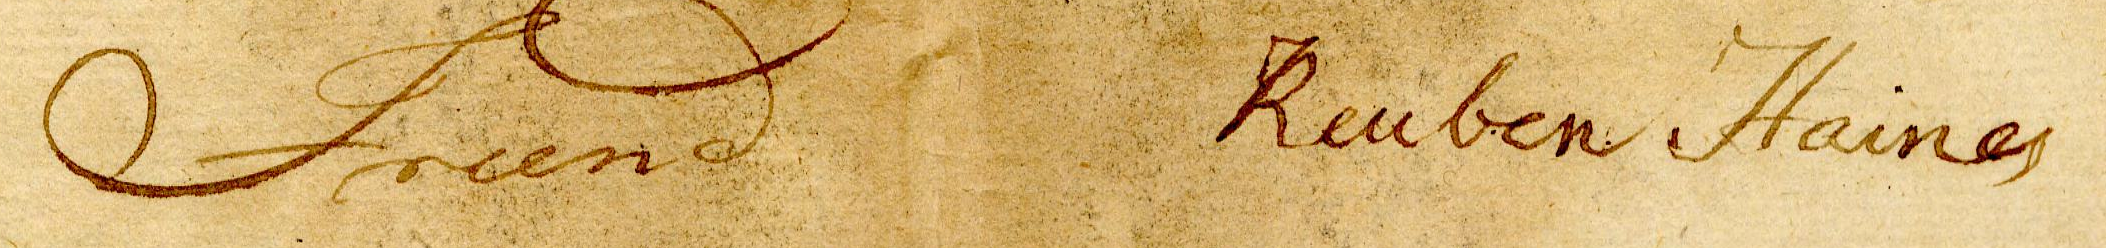Friend Rueben Haines
